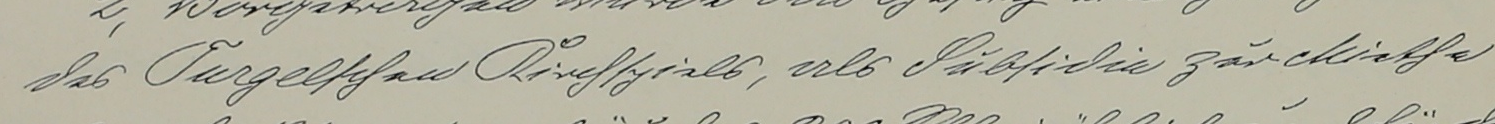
des Turgelschen Kirchspiels, als Subsidie zur Miethe
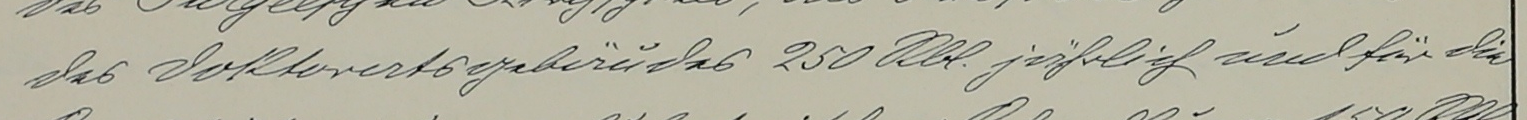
des Doktoratsgebäudes 250 Rbl. jährlich und für die
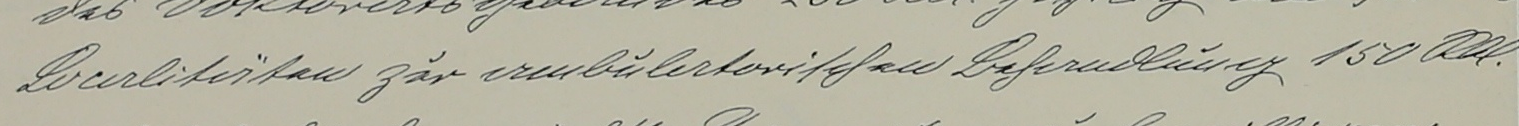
Localitäten zur ambulatorischen Behandlung 150 Rbl.
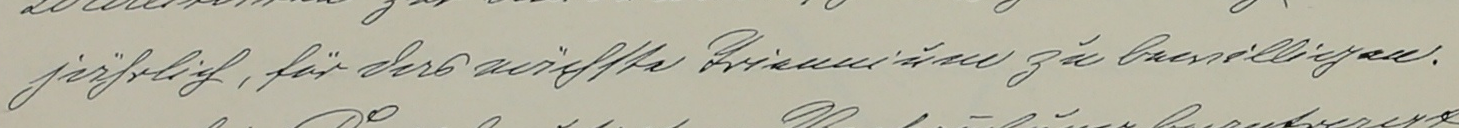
jährlich, für das nächste Triennium zu bewilligen.
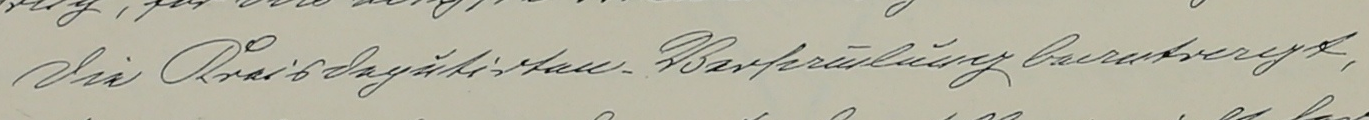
Die Kreisdeputirten-Versammlung beantragt,
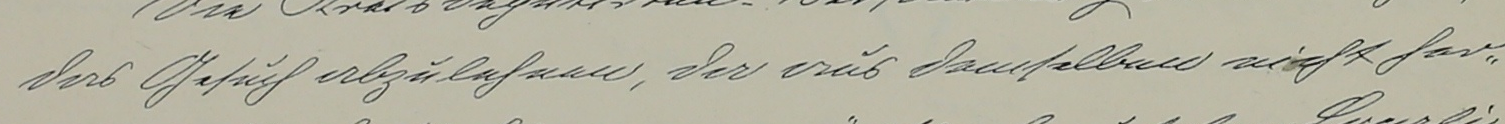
das Gesuch abzulehnen, da aus demselben nicht her-
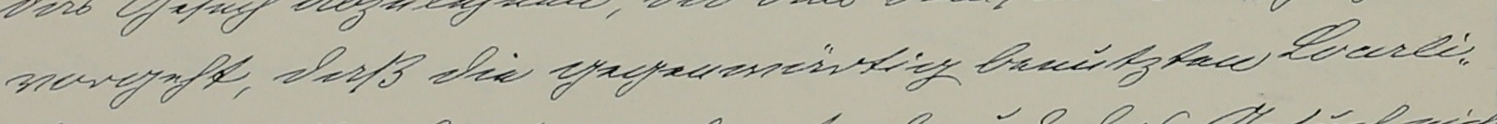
vorgeht, daß die gegenwärtig benutzten Locali-
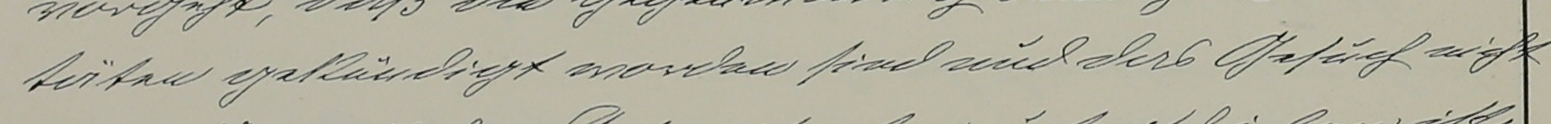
täten gekündigt worden sind und das Gesuch nicht
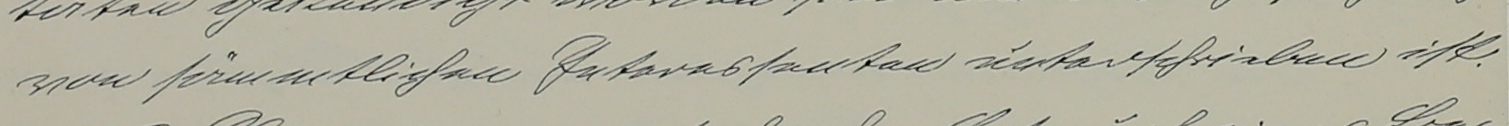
von sämmtlichen Interessenten unterschrieben ist.
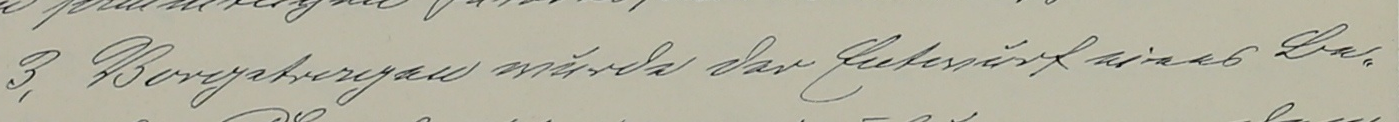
3. Vorgetragen wurde der Entwurf eines Be-
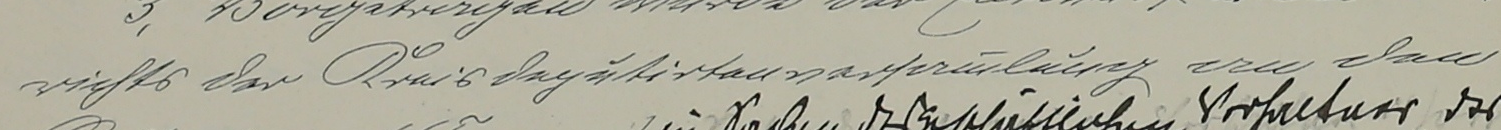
richts der Kreisdeputirtenversammlung an den
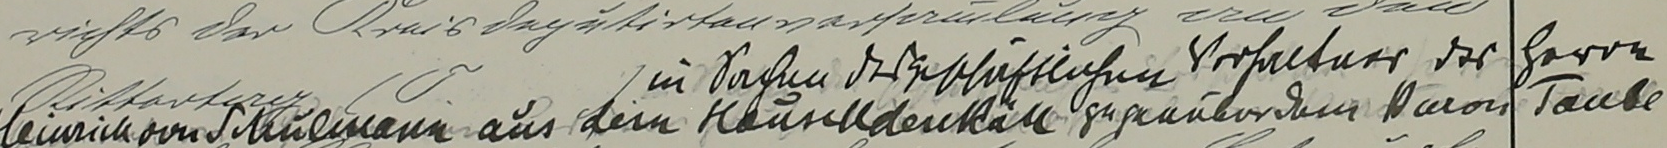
Rittertag (T. ) in Sachen des geschäftlichen Verhaltens des Herrn
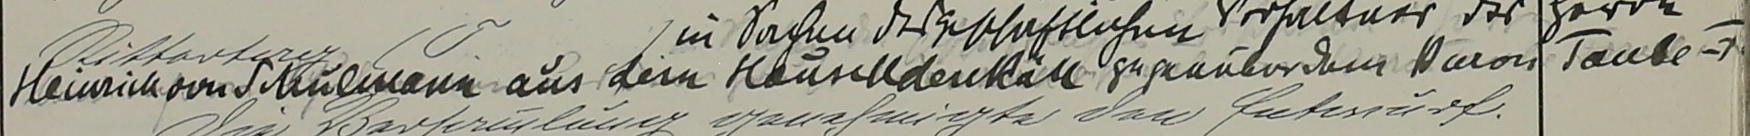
Heinrich von Schulmann aus dem Hause Udenküll gegenüber dem Baron Taube-F
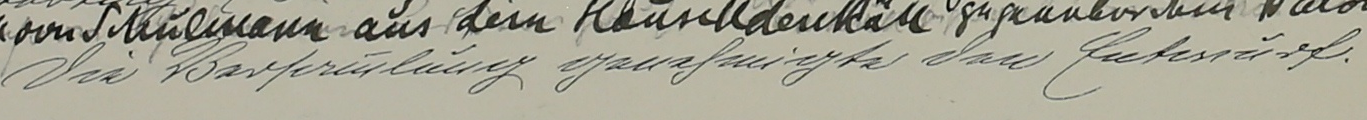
Die Versammlung genehmigte den Entwurf.
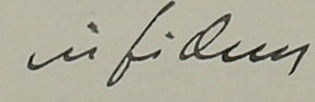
in fidem
